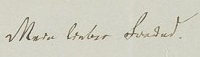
Mein lieber Freund.
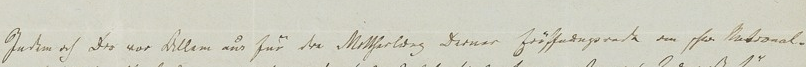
Indem ich Dir vor Allem aus für die Mittheilung Deiner Eröffnungsrede im schw. National-
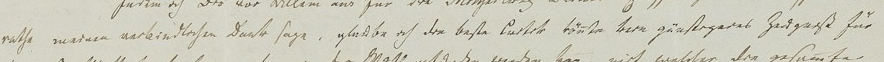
rahte meinen verbindlichen Dank sage, glaube ich die beste Critik könnte kein günstigeres Zeugniß für
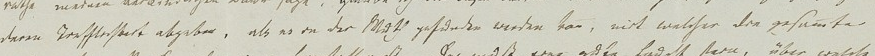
deine Trefflichkeit abgeben, als es in der Wuth gefunden werden kann, mit welcher die gesammte
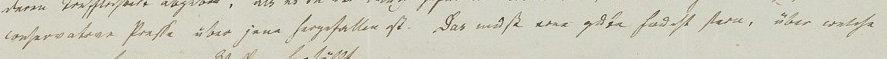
conservative Presse über jene hergefallen ist. Das muß eine gute Frucht sein, über welche
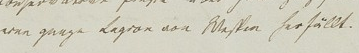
eine ganze Legion von Wespen herfällt.
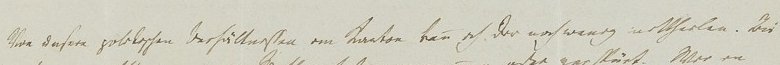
Von unsern politischen Verhältnissen im Kanton kann ich Dir noch wenig mittheilen. Bis
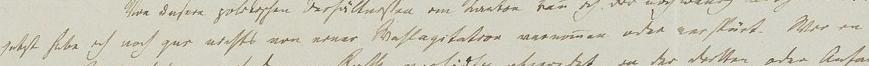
jetzt habe ich noch gar nichts von einer Wahlagitation vernommen oder verspürt. Wir in
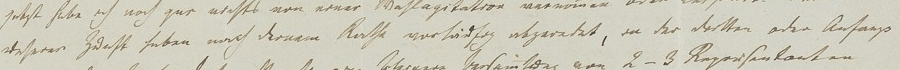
unserer Zunft haben nach deinem Rathe vorläufig abgeredet, in der dritten oder Anfangs
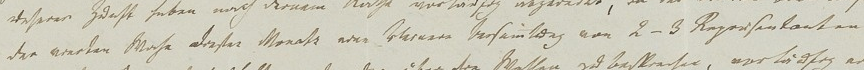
der vierten Woche dieses Monats eine kleinere Versammlung von 2-3 Repräsentanten
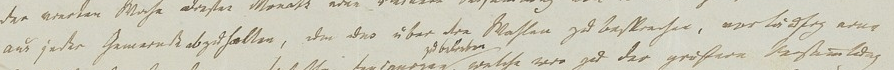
aus jeder Gemeinde abzuhalten, um uns über die Wahlen zu besprechen, vorläufig eine
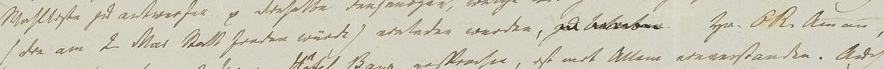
(die am 2 Mai Statt finden würde) einladen werden, zu belieben. Hr. OR. Ammann,
